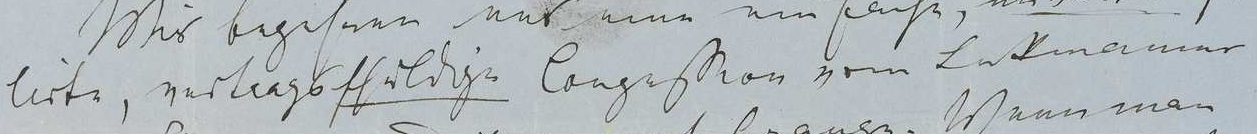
lirte, vertragsschuldige Conzession vom Lukmanier
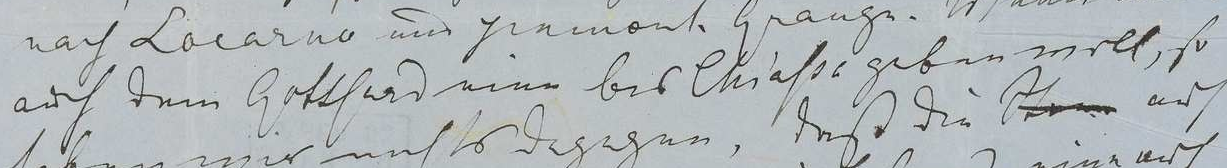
auch dem Gotthard eine bis Chiasso geben will, so
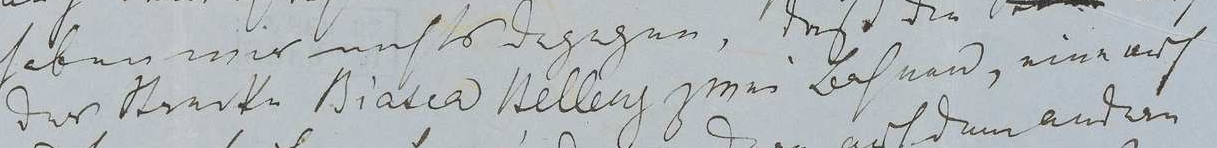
der Strecke BiascaBellenz zwei Bahnen, eine auf
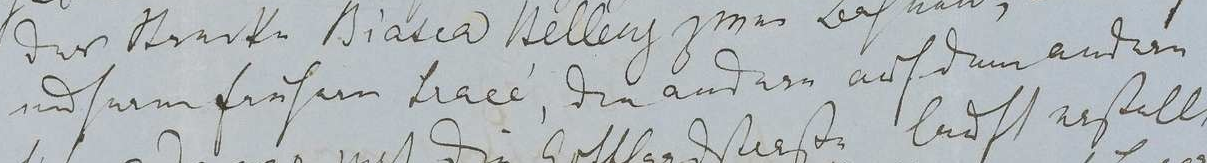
unserm frühern Tracé, die andere auf dem andern
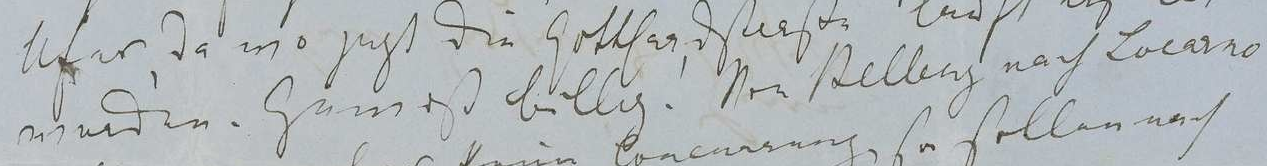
werden. Gewiß billig! Von Bellenz nach Locarno
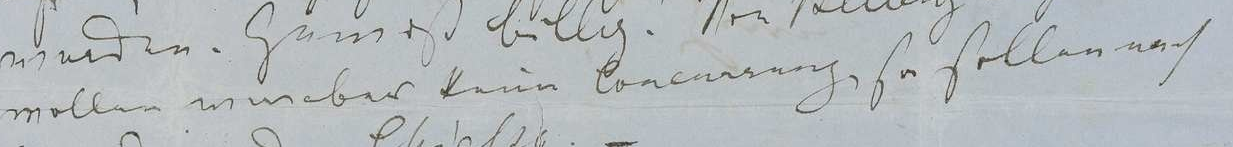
wollen wir aber keine Concurrenz, sie sollen nach
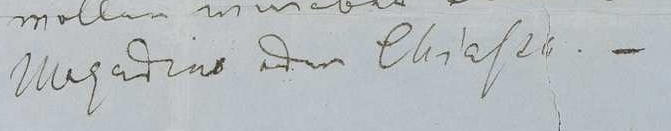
Magadino oder Chiaßo. –
